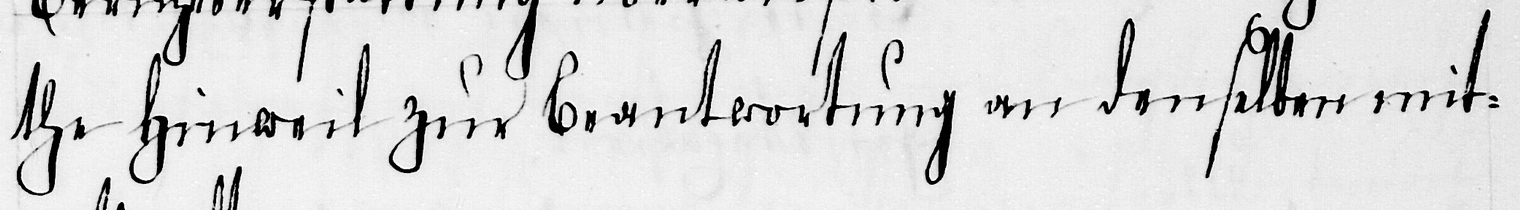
the Hinweil zur Beantwortung an denselben mit¬
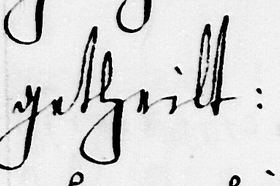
getheilt:
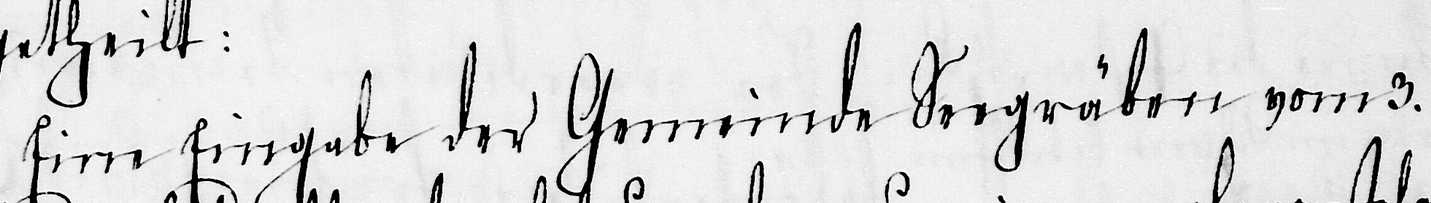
Eine Eingabe der Gemeinde Seegräben vom 3.
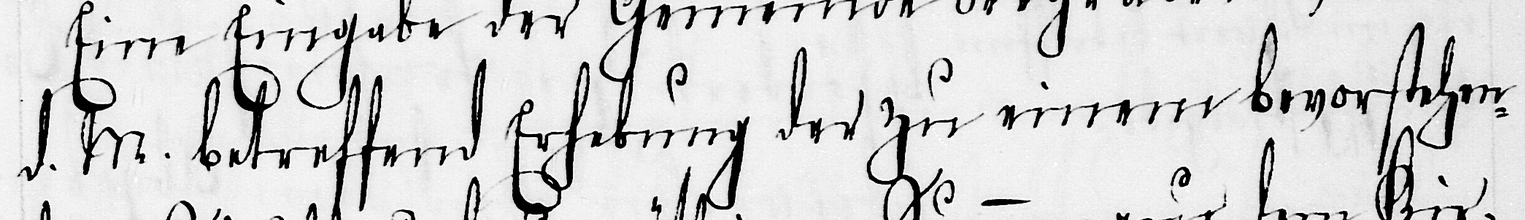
d. M. betreffend Erhebung der zu einem bevorstehen¬
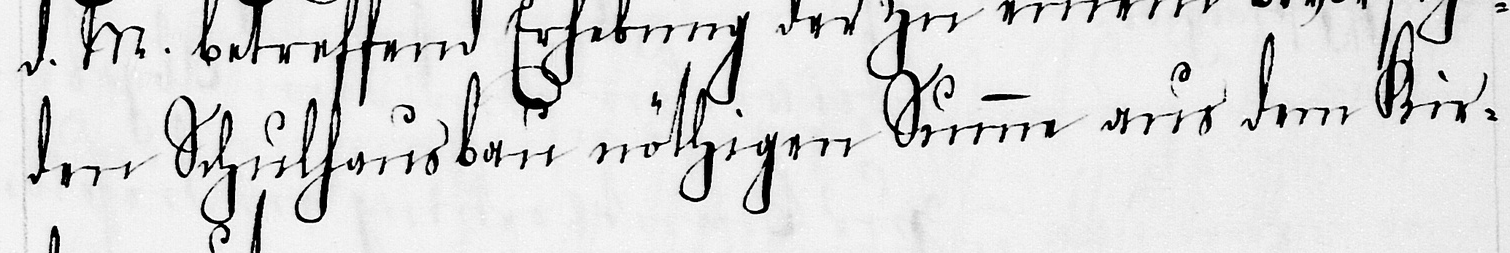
den Schulhausbau nöthigen Summe aus dem Kir¬
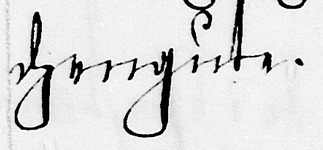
chengute.
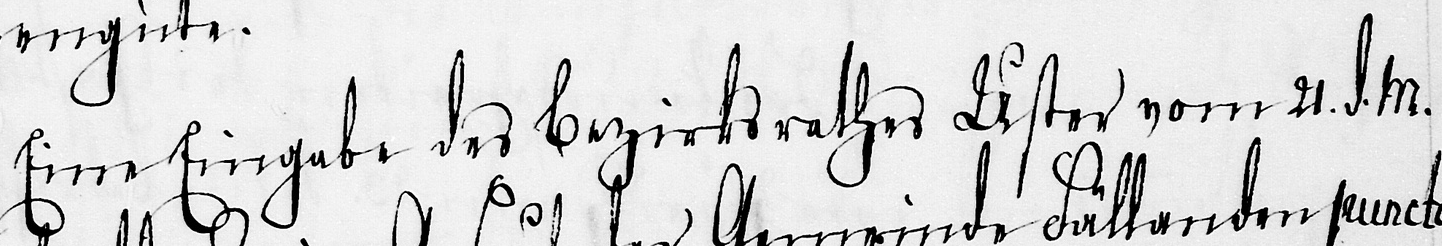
Eine Eingabe des Bezirksrathes Uster vom 21. d. M.
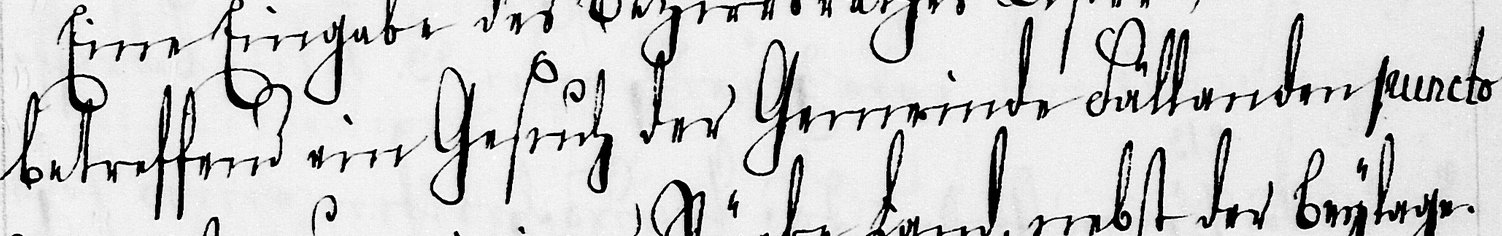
betreffend ein Gesuch der Gemeinde Fällanden puncto
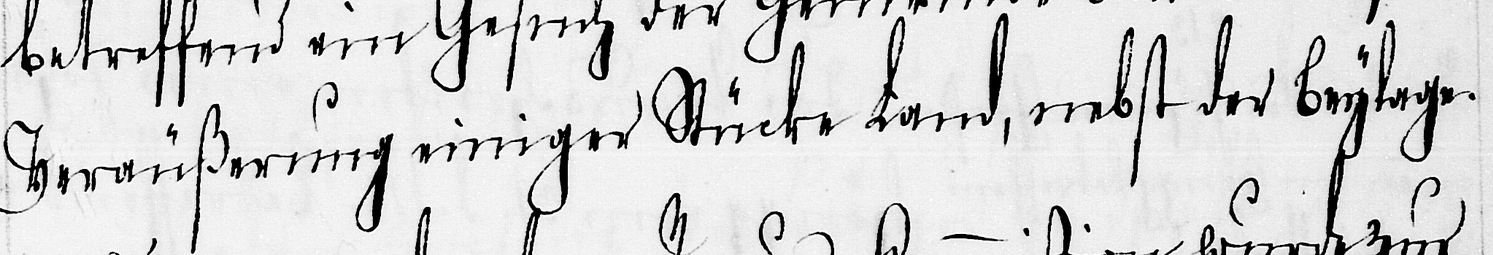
Veräußerung einiger Stücke Land, nebst der Beylage.
